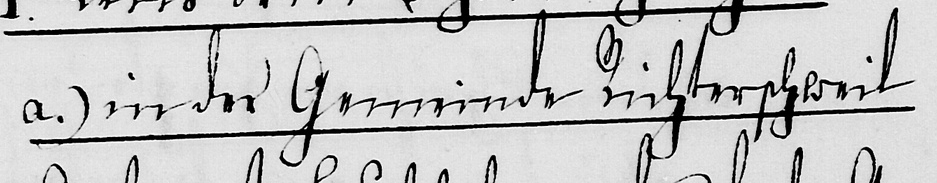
a.) in der Gemeinde Richterschweil
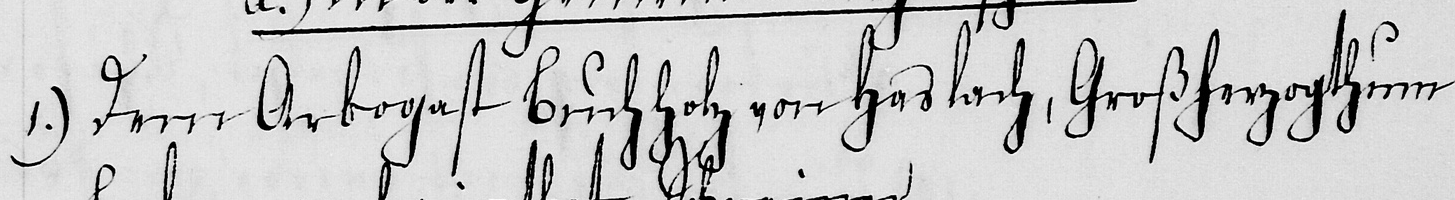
1.) Dem Arbogast Buchholz von Haslach, Großherzogthum
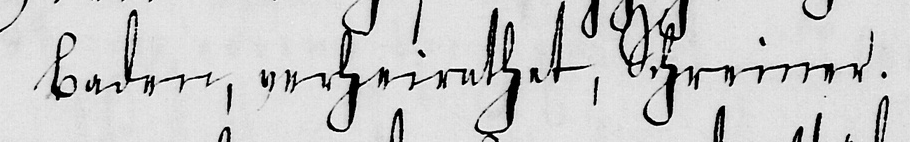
Baden, verheirathet, Schreiner.
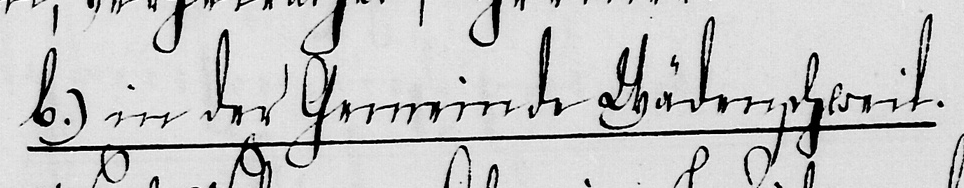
b.) in der Gemeinde Wädenschweil.
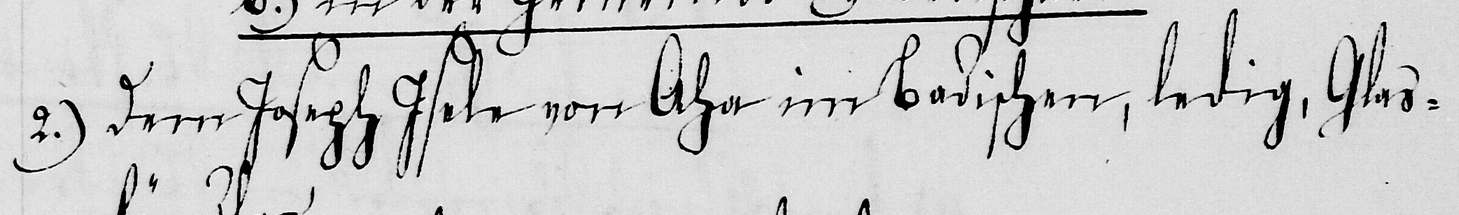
2.) Dem Joseph Isele von Aha im Badischen, ledig, Glas¬
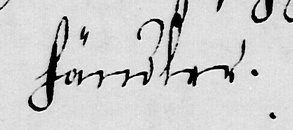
händler.
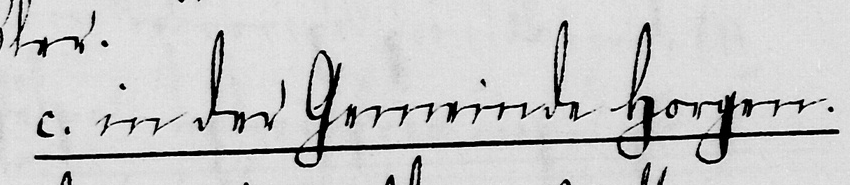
c. in der Gemeinde Horgen.
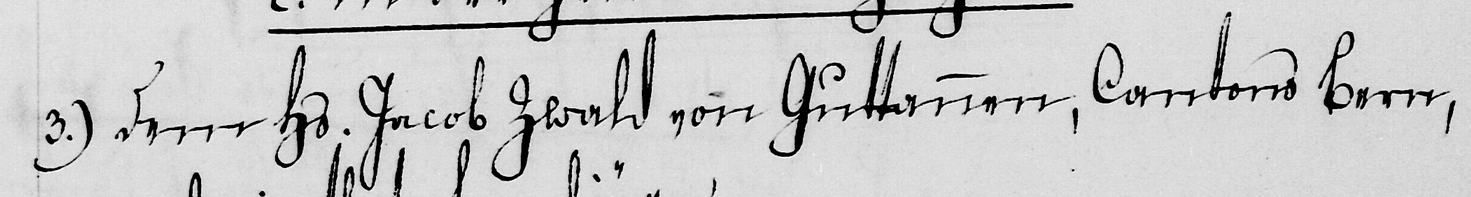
3.) Dem Hs. Jacob Zwald von Guttannen, Cantons Bern,
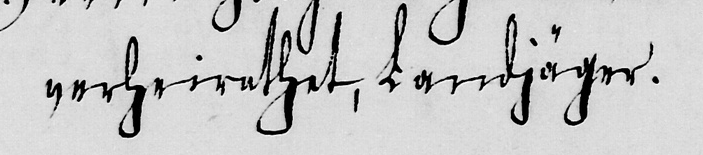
verheirathet, Landjäger.
